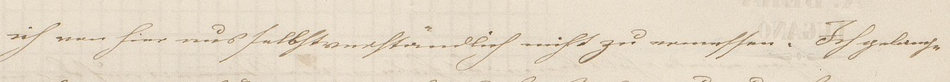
ich von hier aus selbstverständlich nicht zu ermessen. Ich gelange
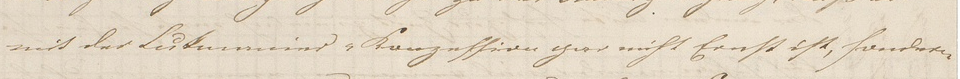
mit der Lukmanier-Konzession gar nicht Ernst ist, sondern
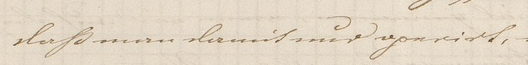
daß man damit nur operirt,
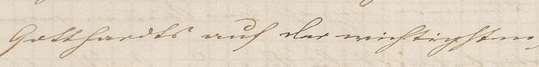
Gotthardts auf der wichtigsten
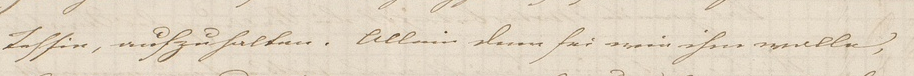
Tessin, aufzuhalten. Allein dem sei wie ihm wolle,
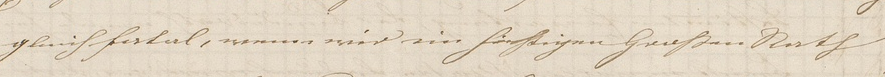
gleich fatal, wenn wir im hießigen Großen Rath
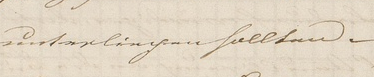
unterliegen sollten.
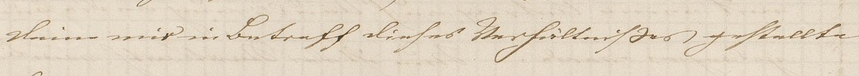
Deine mir in Betreff dieses Verhältnißes gestellte
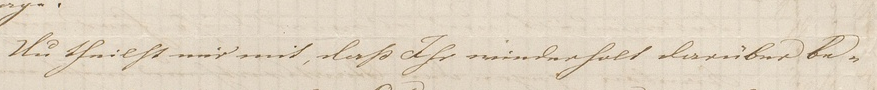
Du theilst mir mit, daß Ihr wiederholt darüber be-
